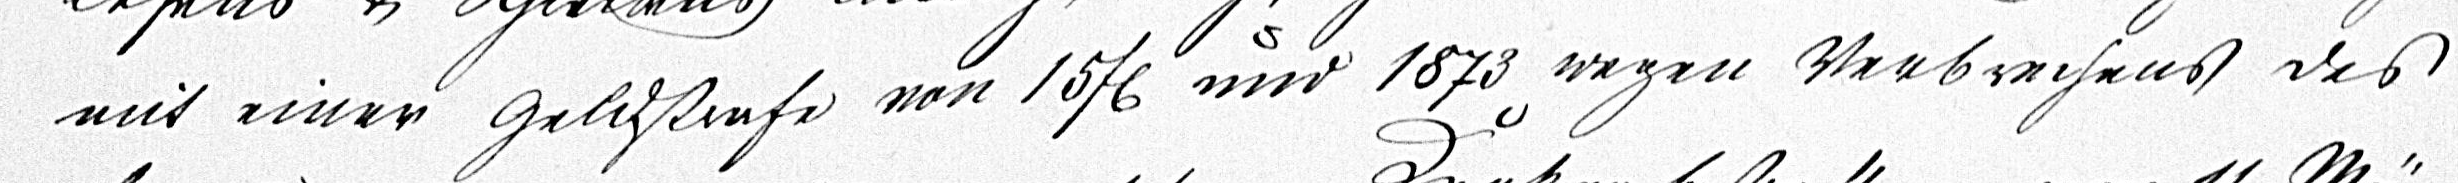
mit einer Geldstrafe von 15/6 nur 1873 wegen Verbrechens des
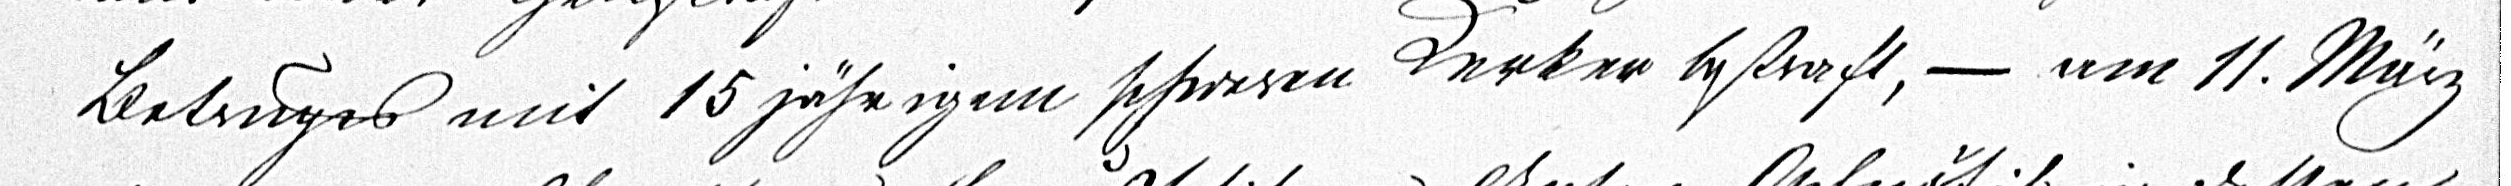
Betruges mit 15jährigem schweren Kerker bestraft, — am 11. März
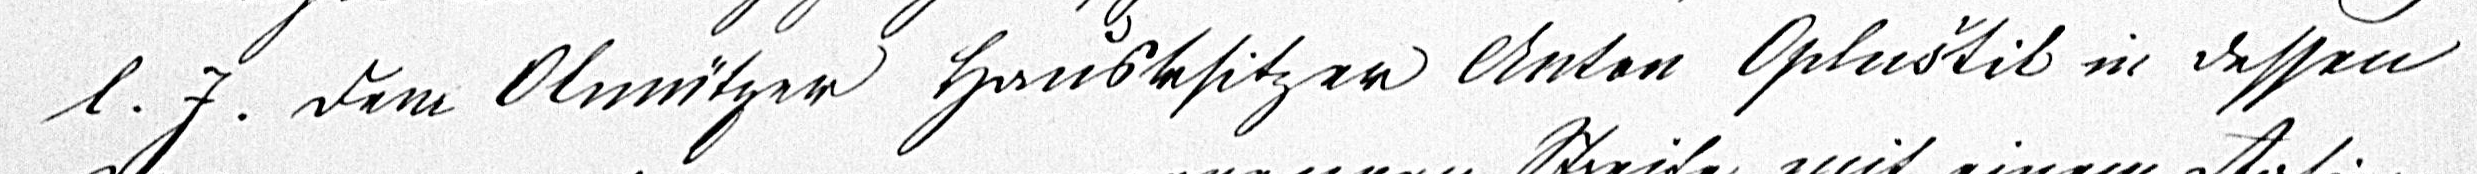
l. J. dem Olmütger Hausbesitzer Anton Oplustil in dessen
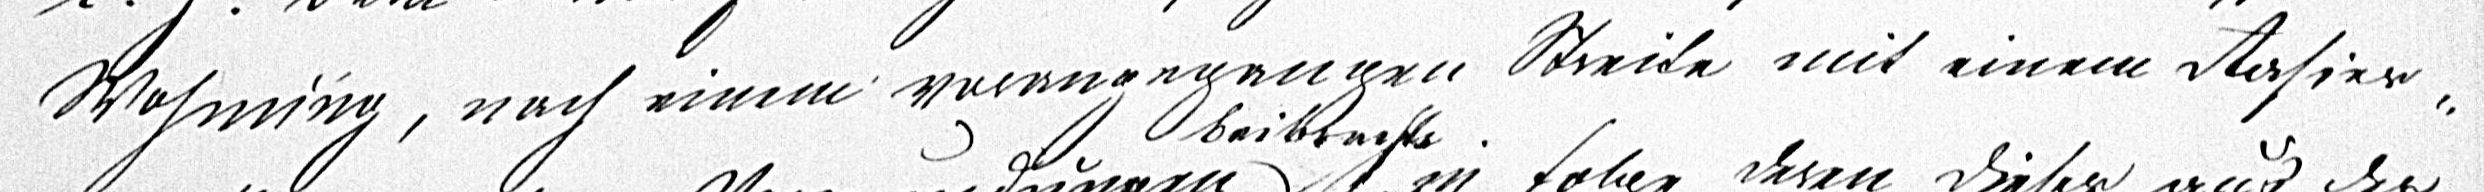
Wohnung, nach einem vorangegangen Streite mit einem xxsier¬
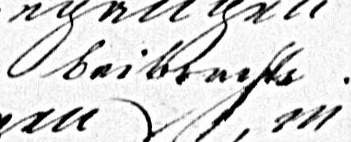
brechte
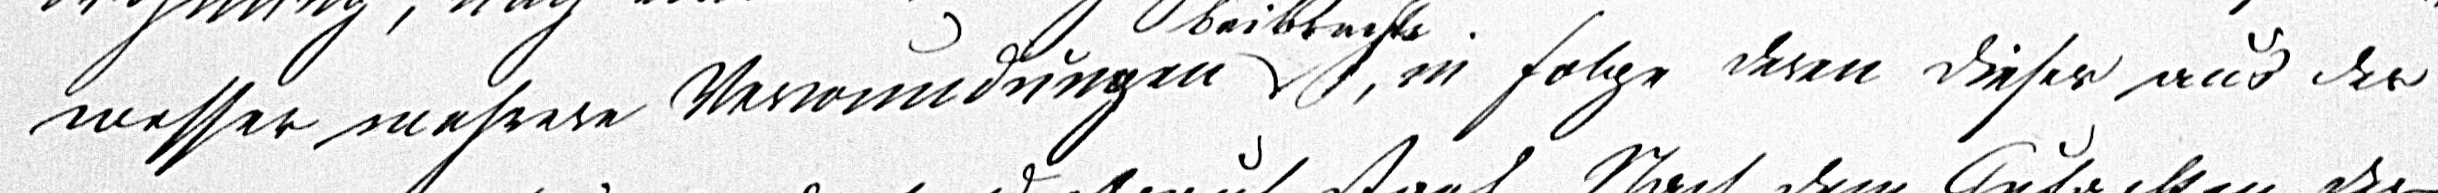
messer mehrere Verwundungen bei, in folge deren dieser aus der
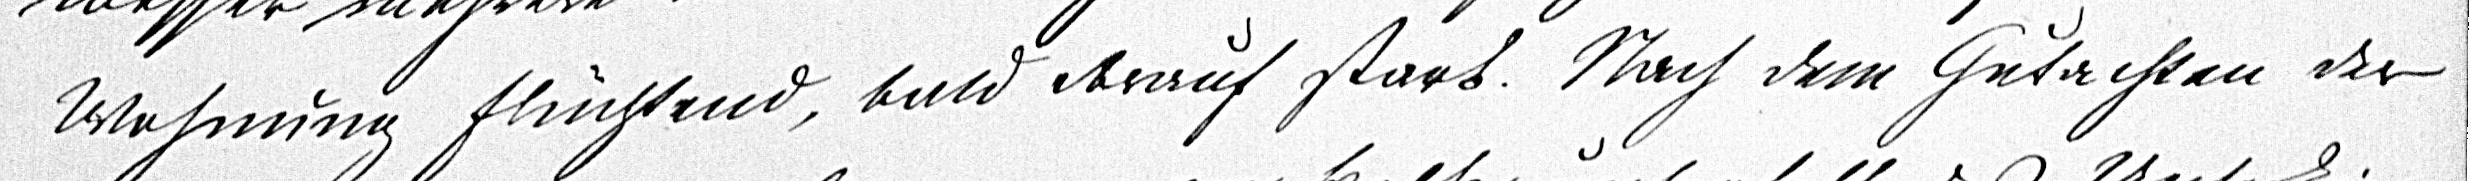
Wohnung flüchtend, bald darauf starb. Nach dem Gutachten der
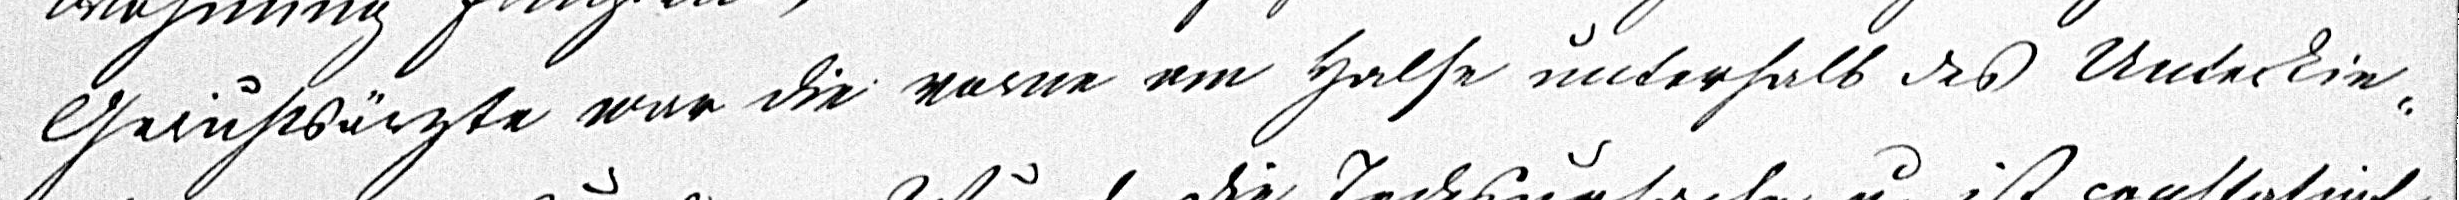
Gerichtsärzte war die vorne am Halse unterhalb des Unterkie¬
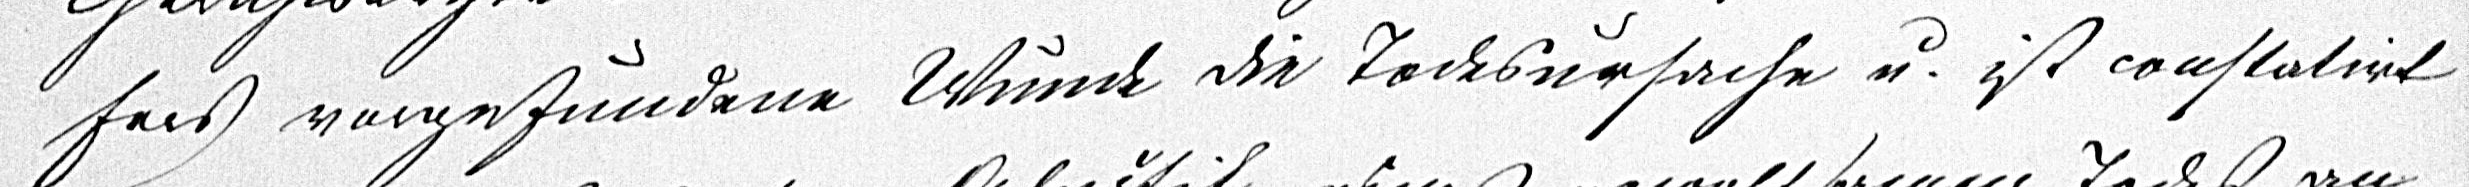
fers vorgefundene Wunde die Todesursache u. ist constatirt
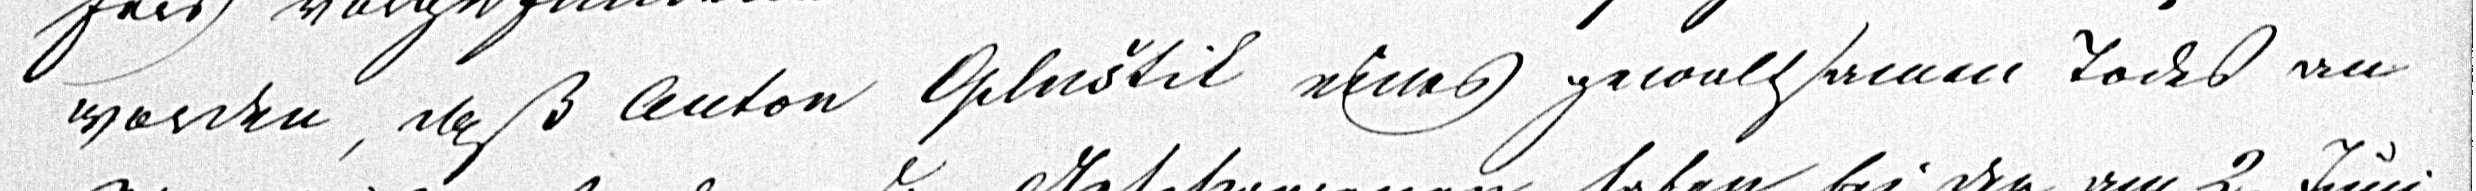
worden, daß Anton Opluštil eines gewolxxamm Todes an
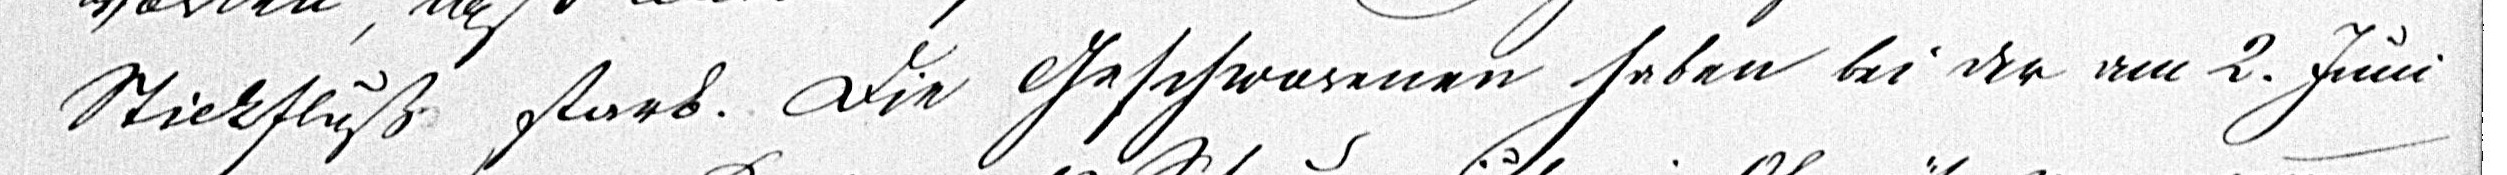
Stickfluß starb. Die Geschworenen haben bei der am 2. Juni
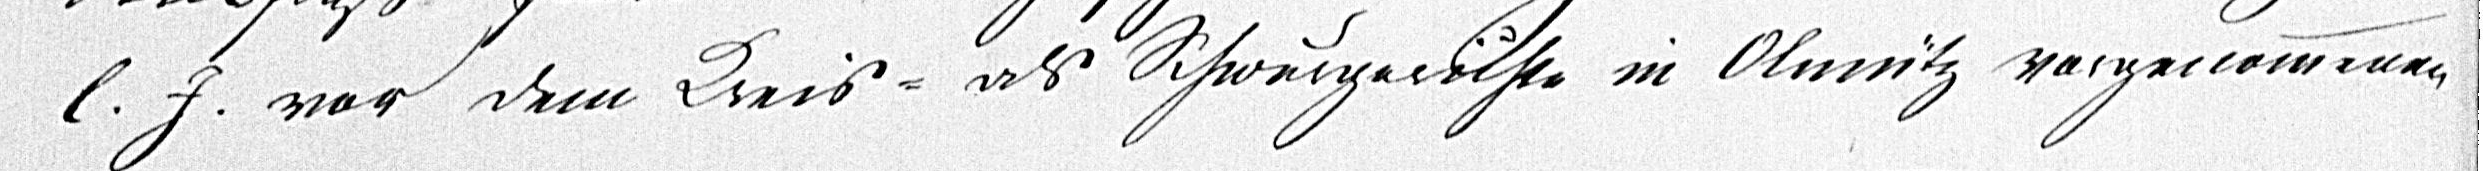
C. J. vor dem Kreis- als Schweigerichte in Olmütz vorgenommen
